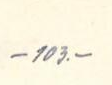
103
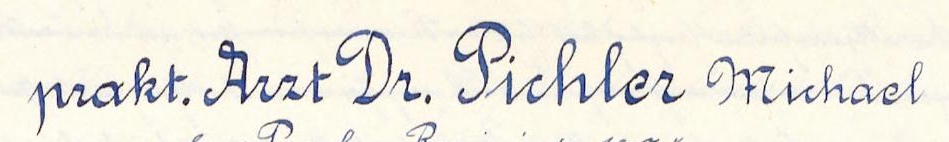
prakt. Arzt Dr. Pichler Michael
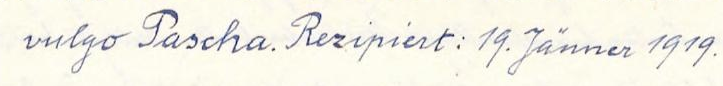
vulgo Pascha. Rezipiert: 19. Jänner 1919.
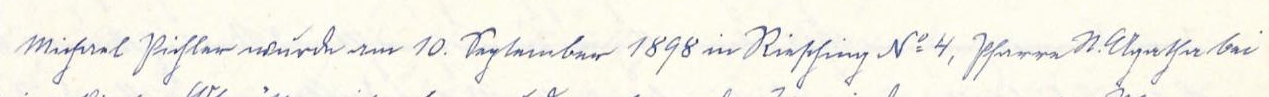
Michael Richter wurde am 10. September 1898 in Riesching Nr 4, Pfarre St. Agatha bei
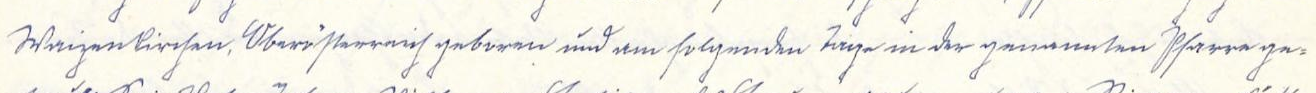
Waizenkirchen, Oberösterreich geboren und am folgenden Tage in der genannten Pfarre ge-
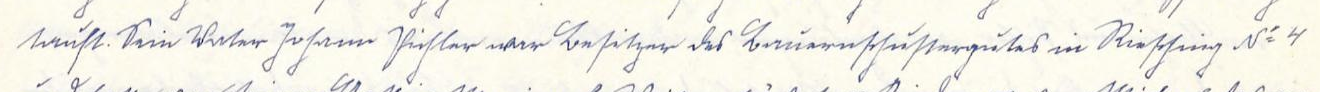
tauft. Sein Vater Johann Pichler war Besitzer des Bauernschustergutes in Riesching Nr 4
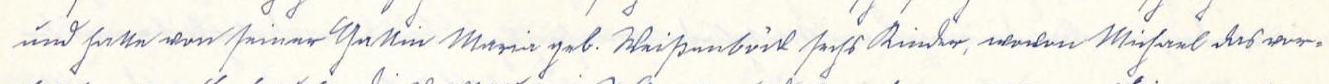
und hatte von seiner Gattin Maria geb. Weißenböck sechs Kinder, wovon Michael das vor-
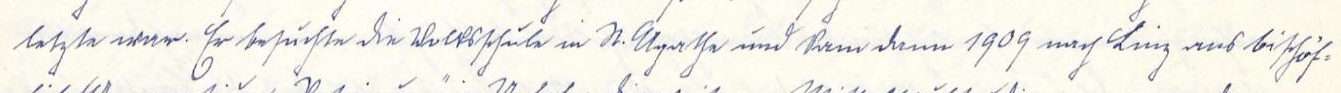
letzte war. Er besuchte die Volksschule in St. Agathe und kam dann 1909 nach Linz ans bischöf-
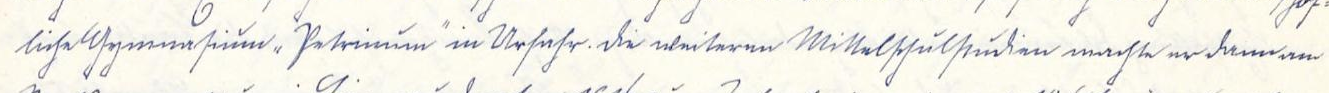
liche Gymnasium Petrinum in Urfahr. Die weiteren Mittelschulstudien machte er dann am
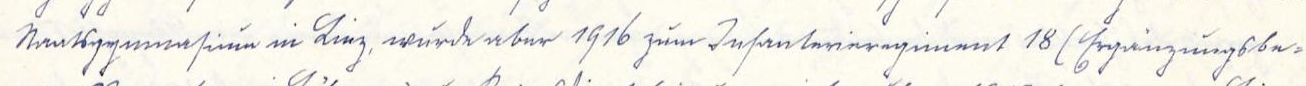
Staatsgymnasium in Linz, wurde aber 1916 zum Infanterieregiment 18 (Ergänzungsbe-
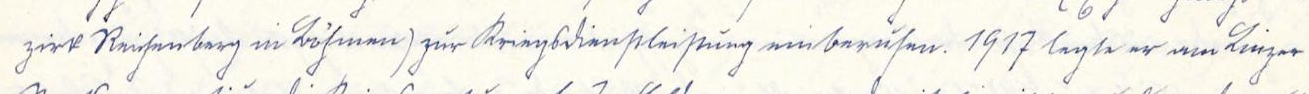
zirk Reichenberg in Böhmen) zur Kriegsdienstleistung einberufen. 1917 legte er am Linzer
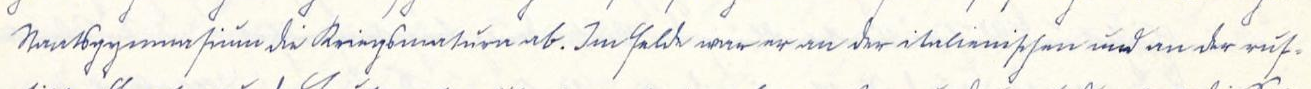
Staatsgymnasium die Kriegsmatura ab. Im Felde war er an der italienischen und an der rus-
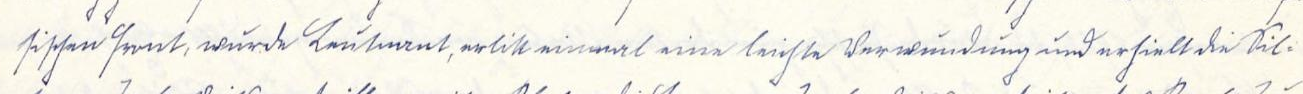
sischen Front, wurde Leutnant, erlitt einmal eine leichte Verwundung und erhielt die Sil-
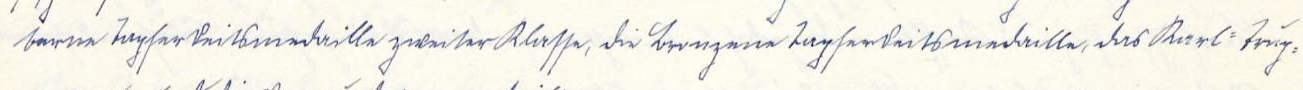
berne Tapferkeitsmedaille zweiter Klasse, die Bronzene Tapferkeitsmedaille, das Karl- Trup-
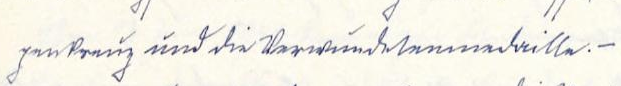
penkreuz und die Verwundetenmedaille.-
